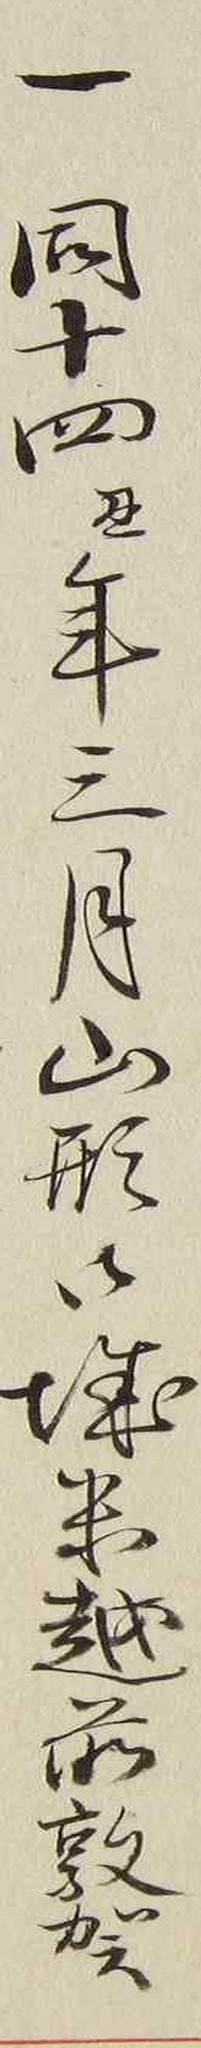一同十四丑年三月山形御城米越前敦賀
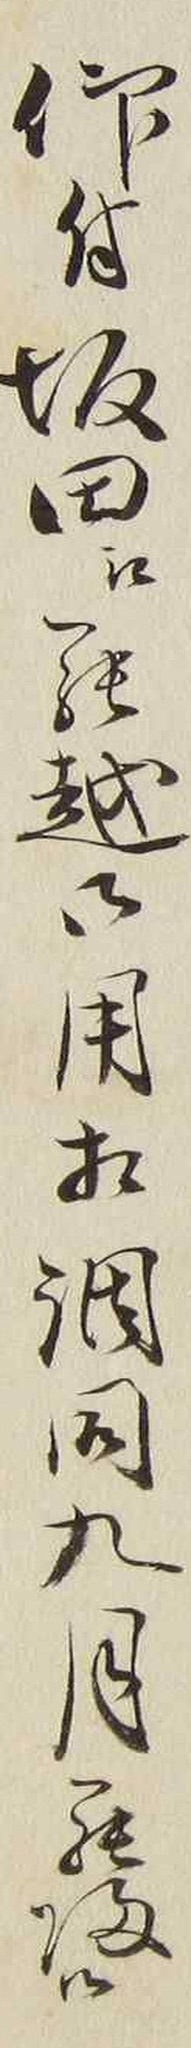仰付坂田ぇ罷越御用相調同九月罷帰候

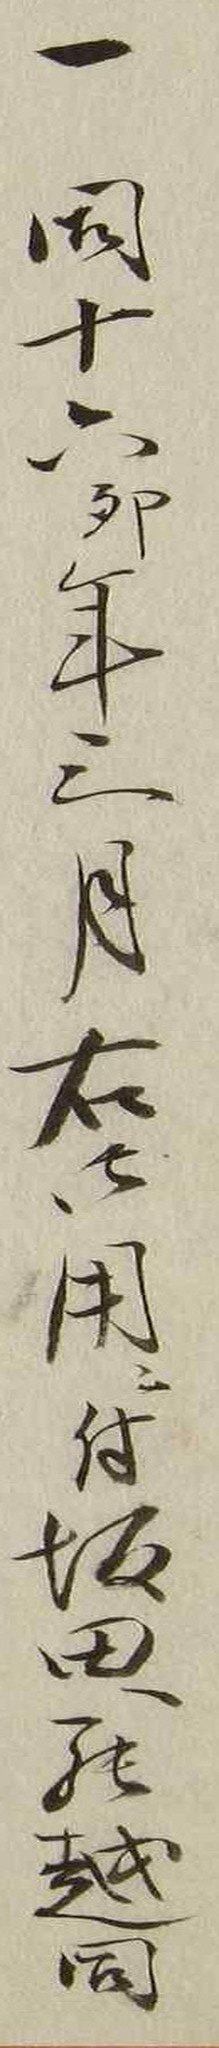一同十六卯年三月右御用ニ付坂田ㇸ罷越同
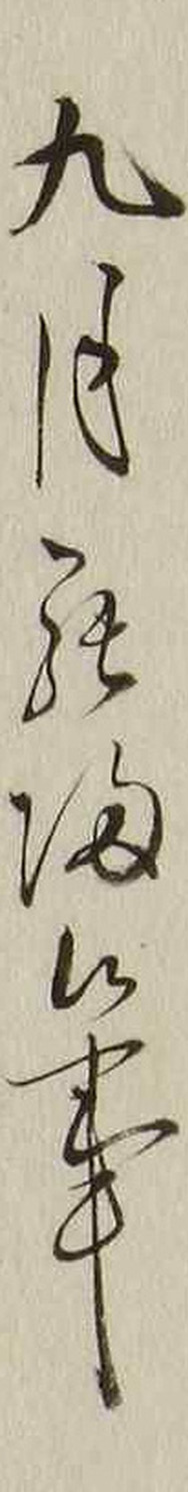九年罷帰候事
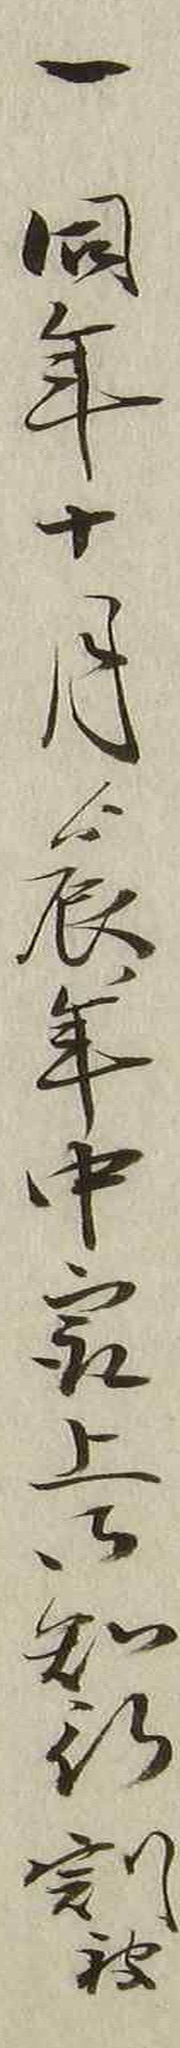一同年十月ゟ辰年中最上御知行割被
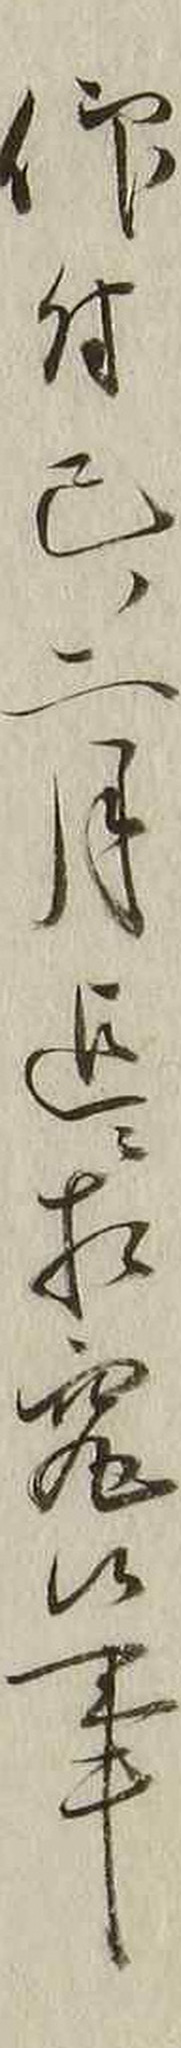仰付巳之二月迄ニ相究候事
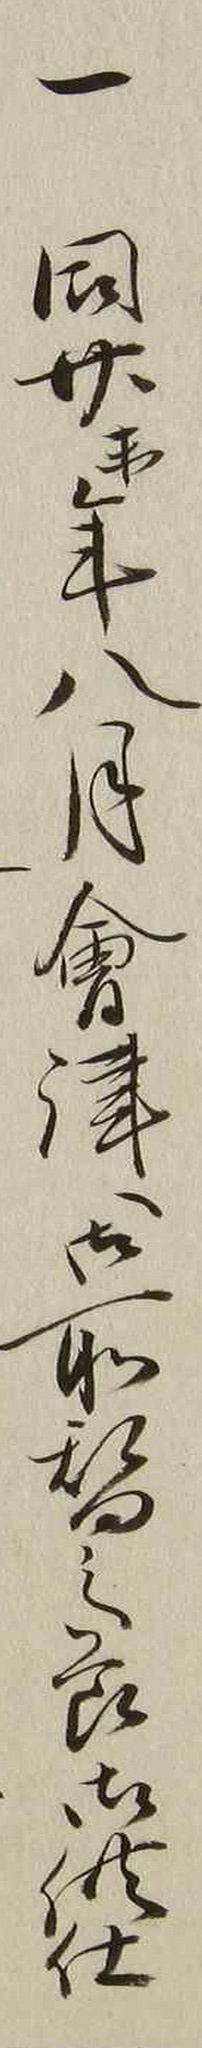一同廿未年八月会津ㇸ御取替之節御供仕
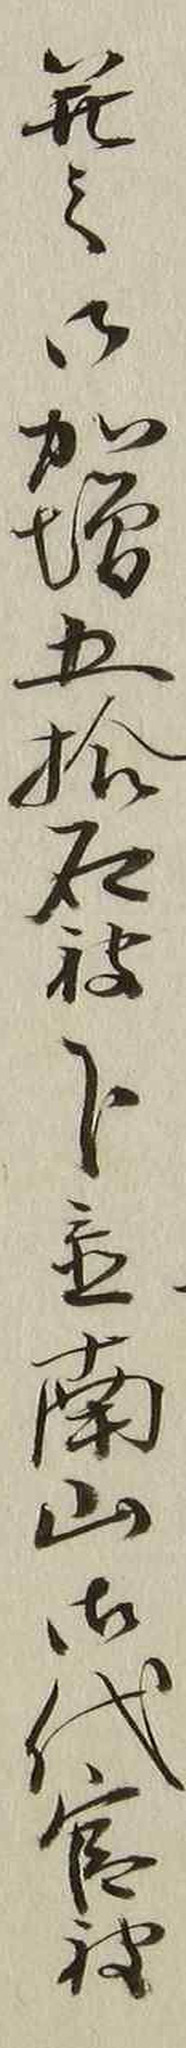幷之御加増五拾石被下置南山御代官被
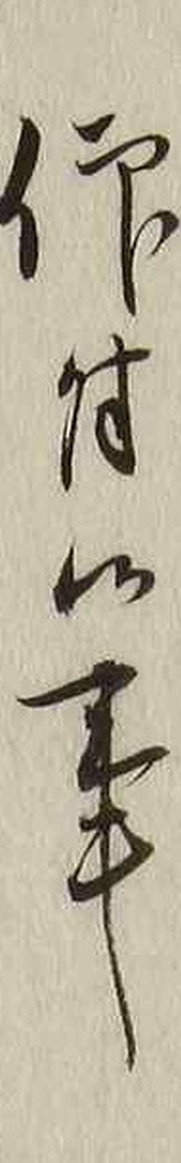仰付候事
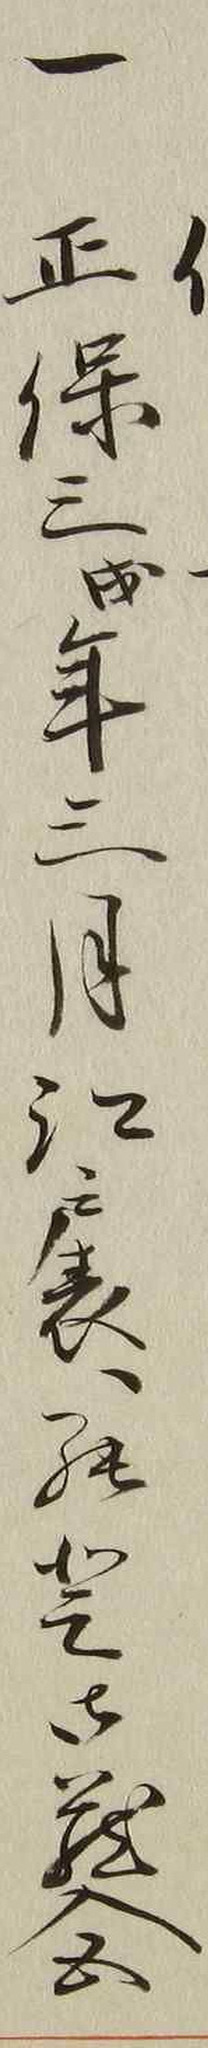一正保三戌年三月江戸表ㇸ罷登御蔵入五
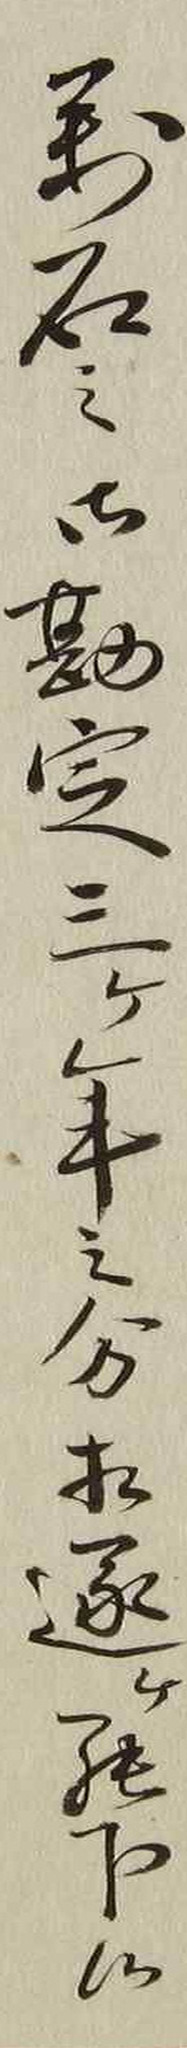万石之御勘定三ヶ年之分相遂ヶ罷下候
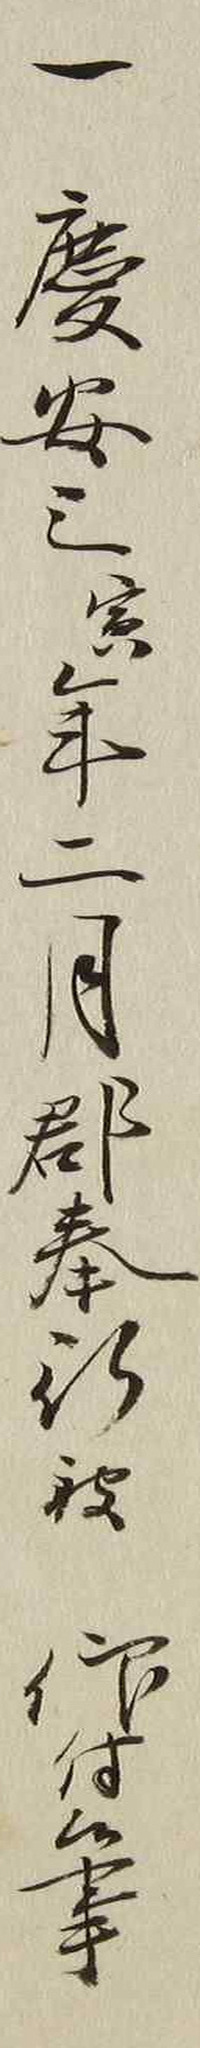一慶安三寅年二月郡奉行被仰付候事
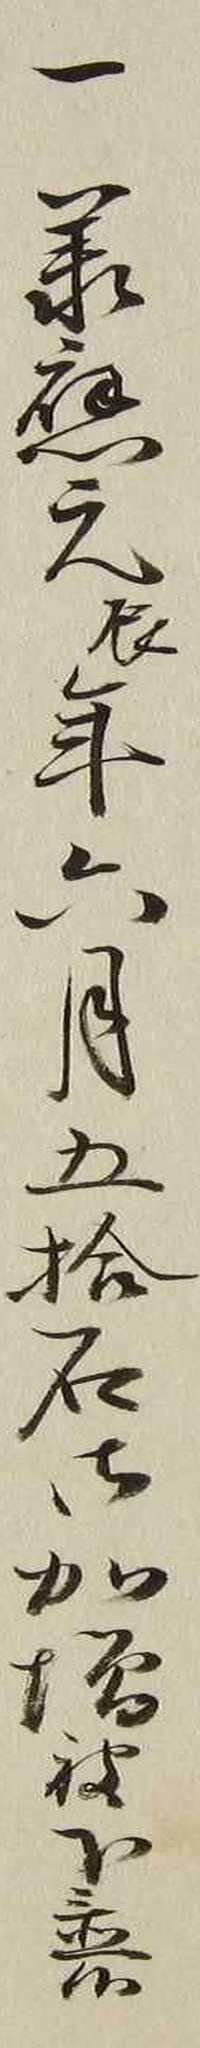一承応元辰年六月五拾石御加増被下置候
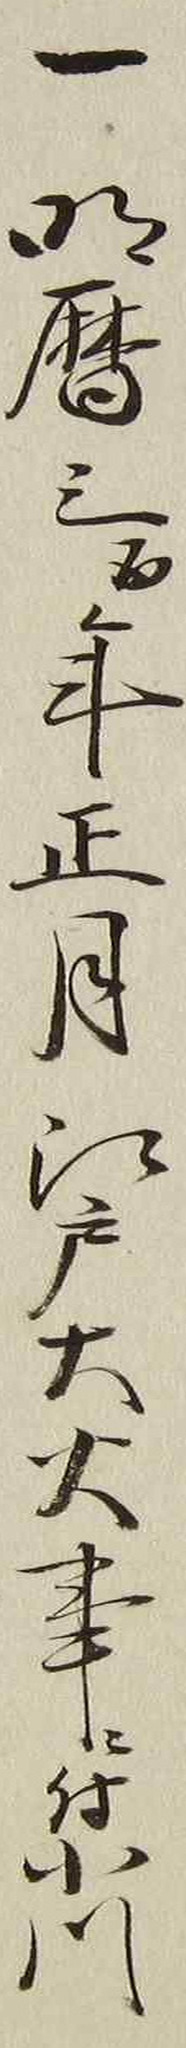一明暦三酉年正月江戸大火事ニ付小川
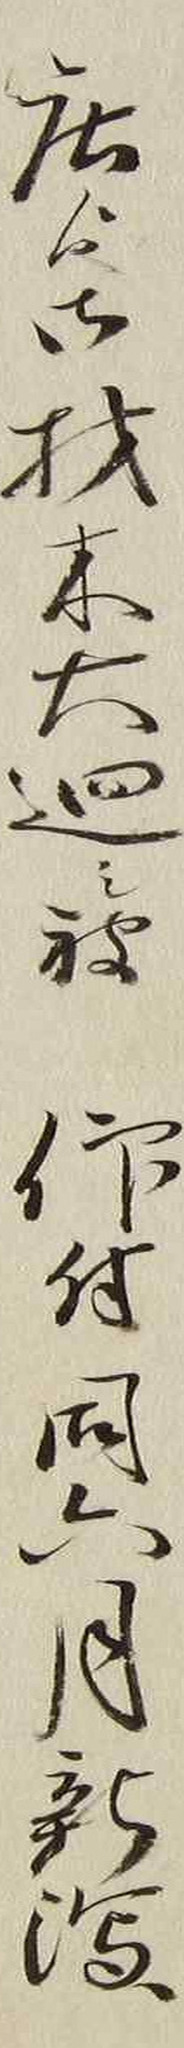店ゟ御材木大廻ㇱ被仰付同六月新潟ㇸ
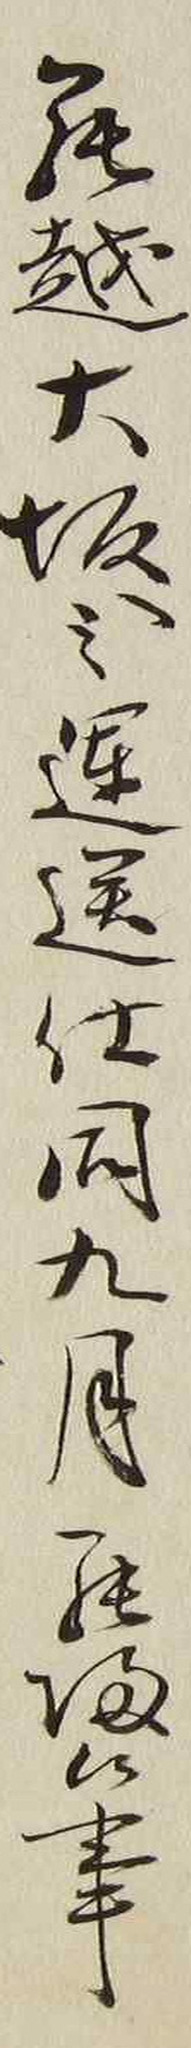罷越大阪ㇸ運送仕同九月罷帰候事
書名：諸士系譜　巻之163　な之部5
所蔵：会津若松市立会津図書館
